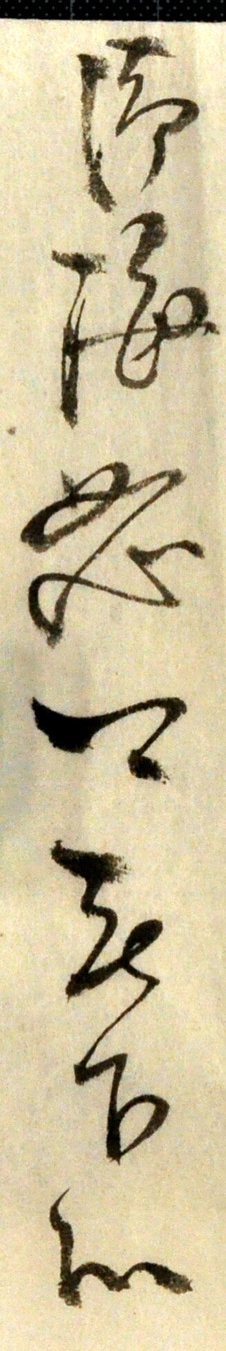御海恕可被下候
